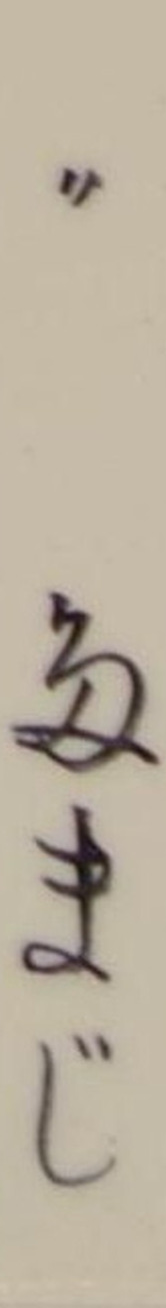たまじ
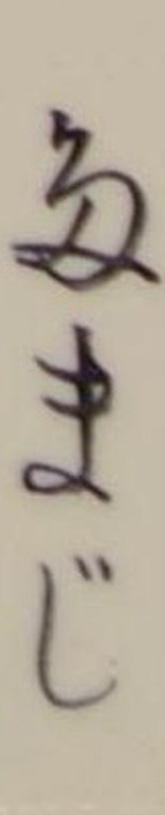たまじ
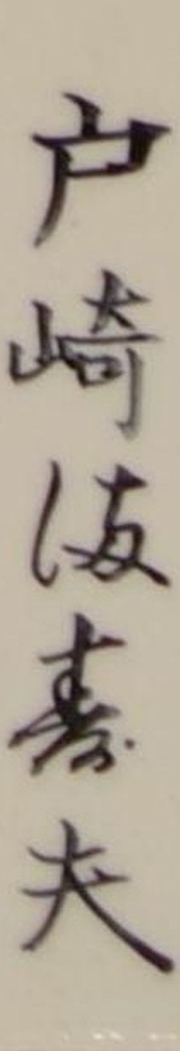戸崎ます夫
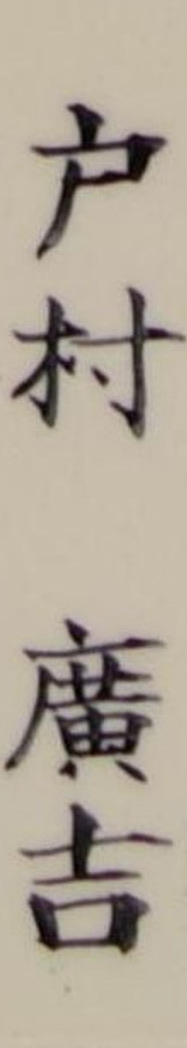戸村廣吉
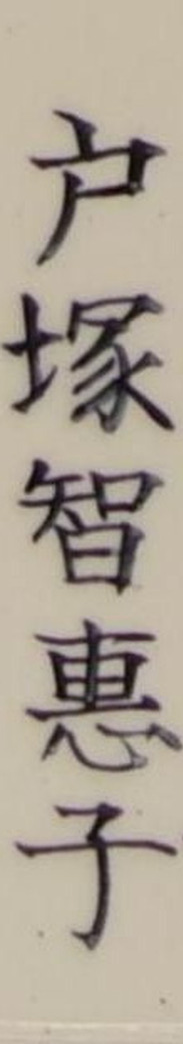戸塚智惠子
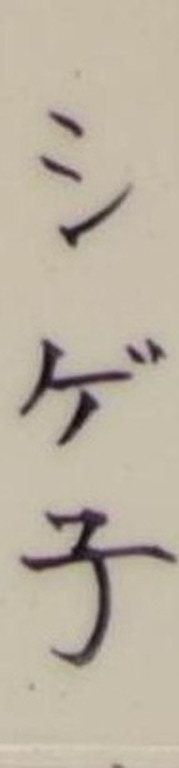シゲ子
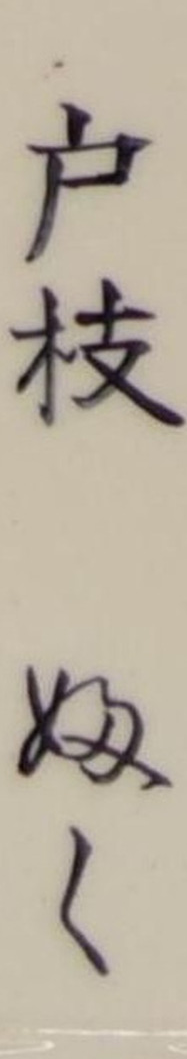戸枝ふく
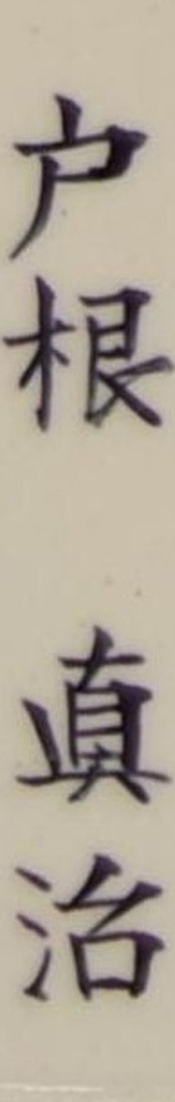戸根真治
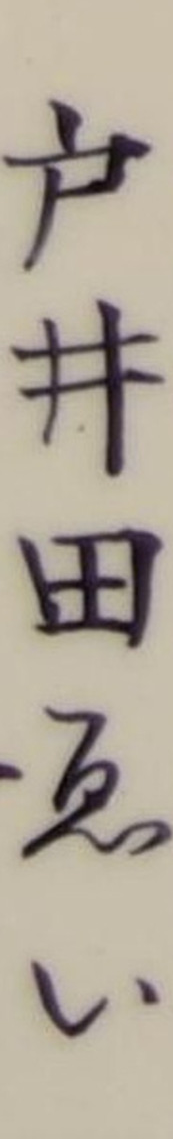戸井田えい
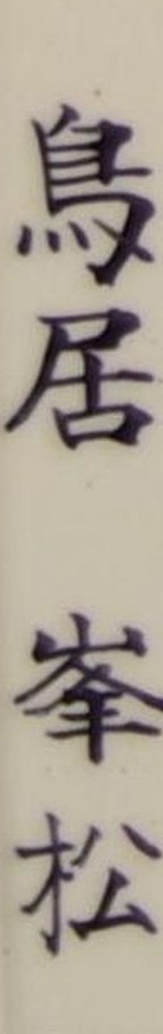鳥居峯松

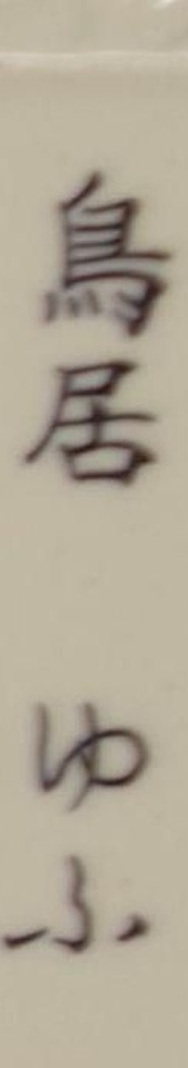鳥居ゆふ
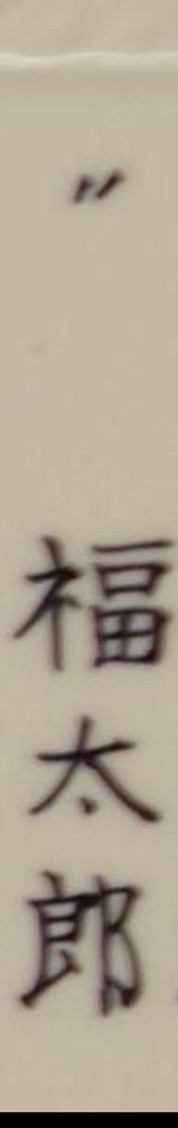福太郎
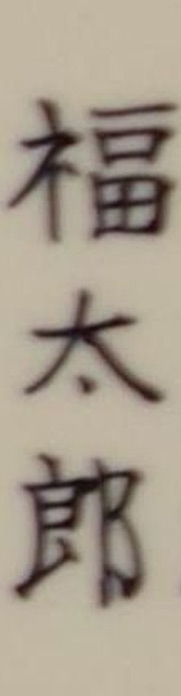福太郎
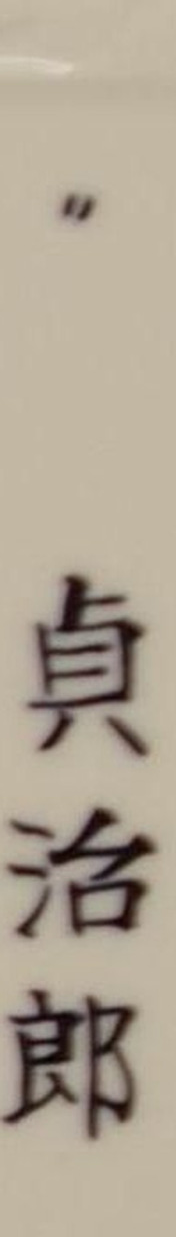貞治郎
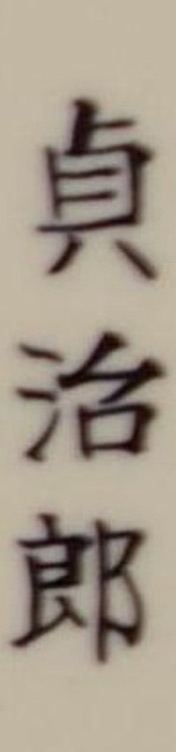貞治郎
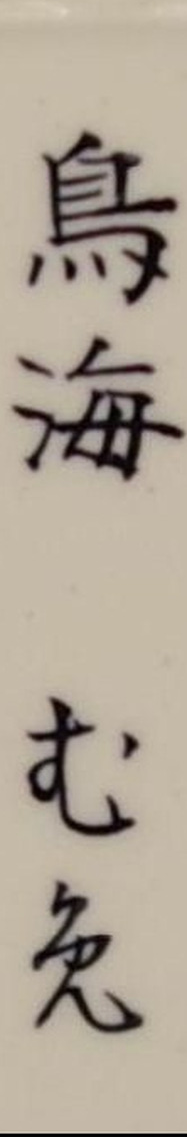鳥海むめ
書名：M~S
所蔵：高野山金剛峯寺
